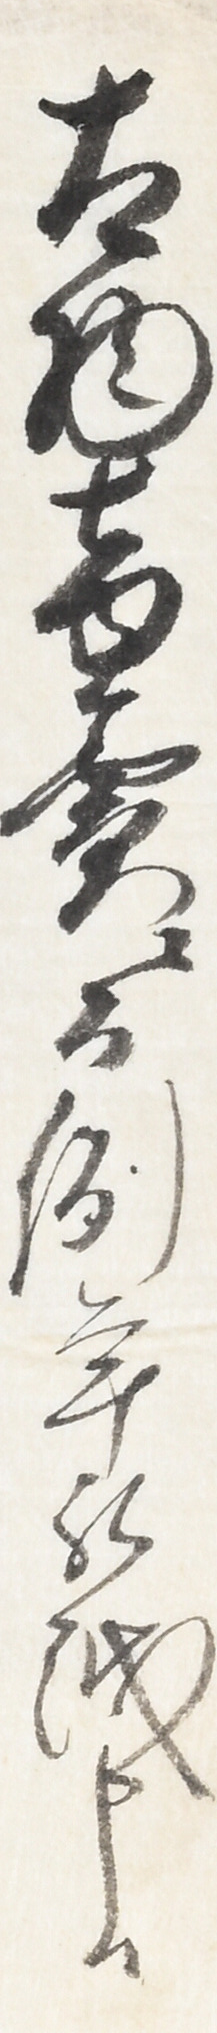太物商売ニ而例年罷越申候
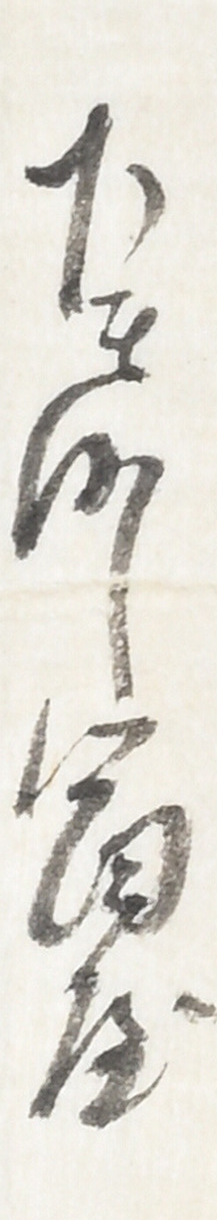下モ町冨屋
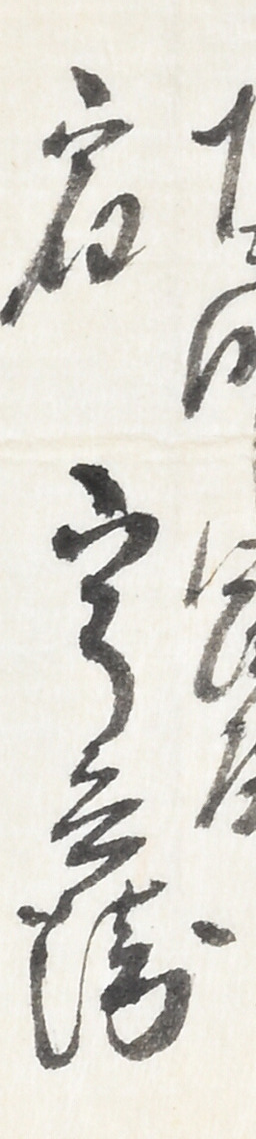宿宇兵衛
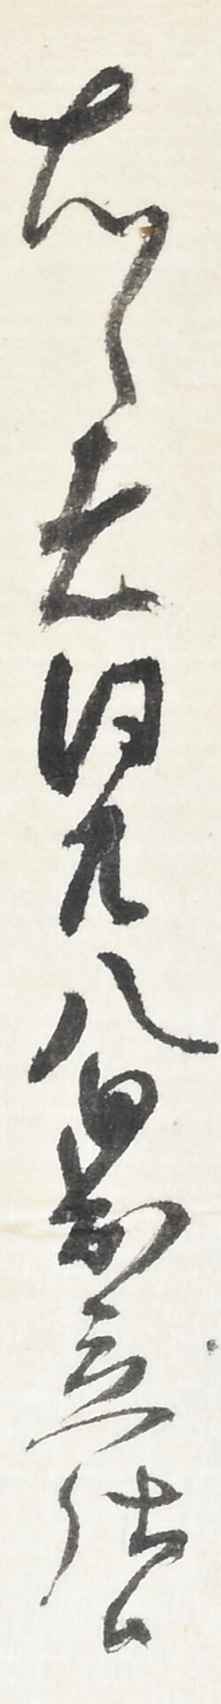右之者同廿八日出立仕候
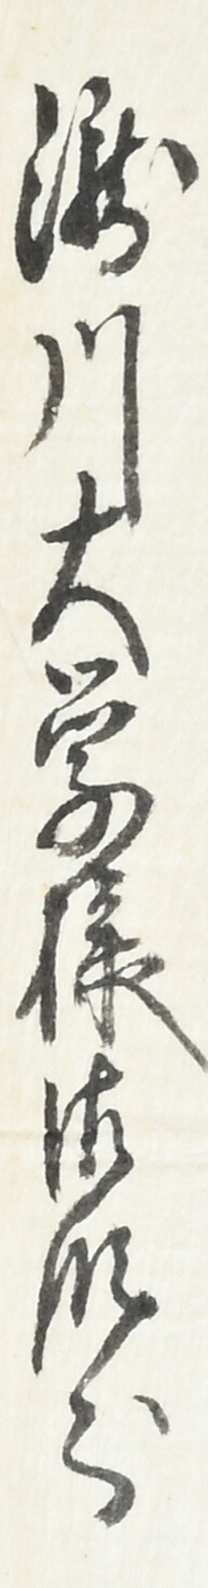一瀧川大学様御領分
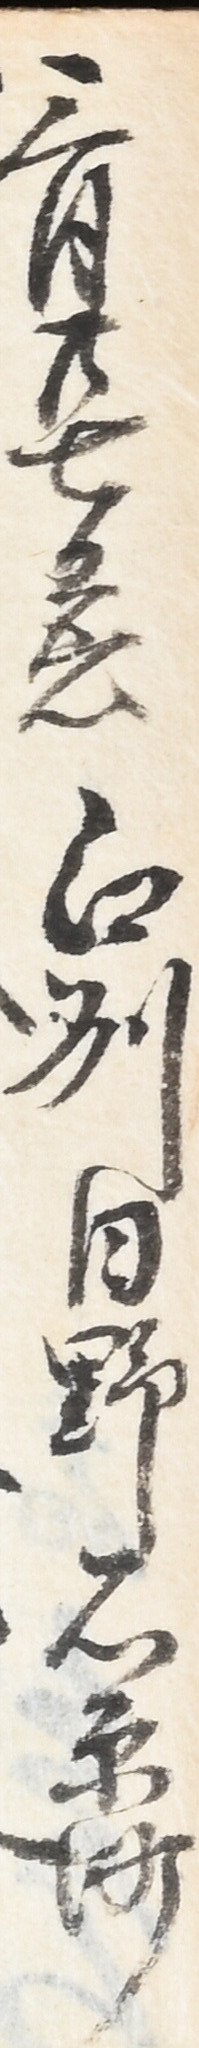三月廿日着江州八幡大工町
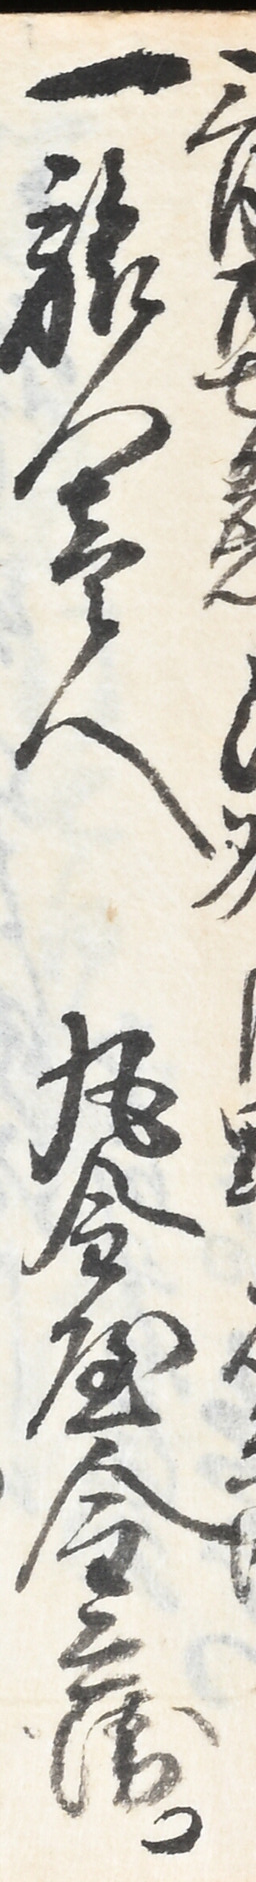一旅人弐人丸屋吉兵衛・
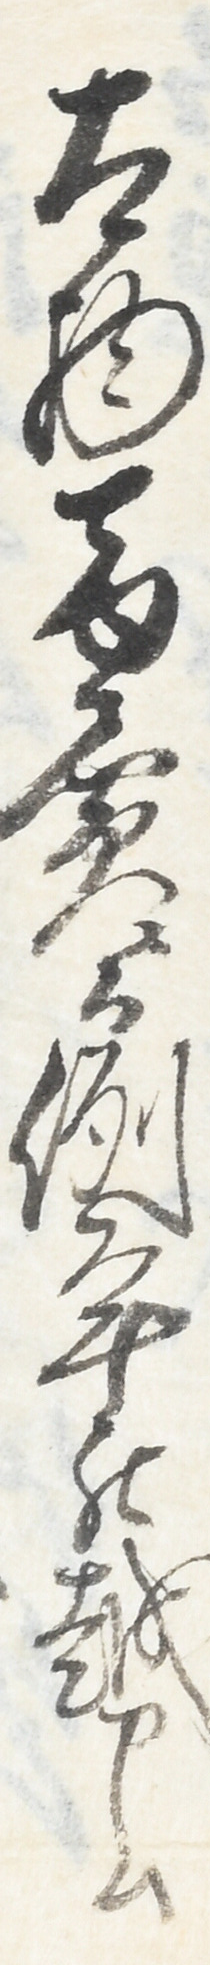太物商売ニ而例年罷越申候
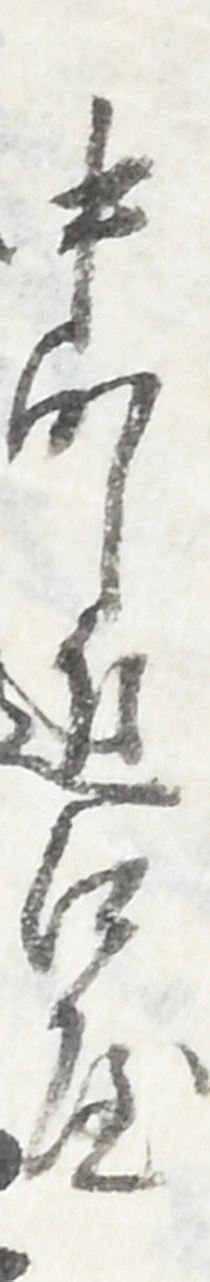中町近江屋
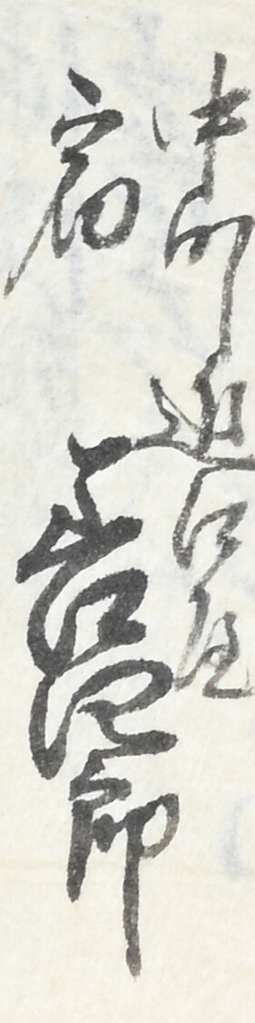宿善四郎

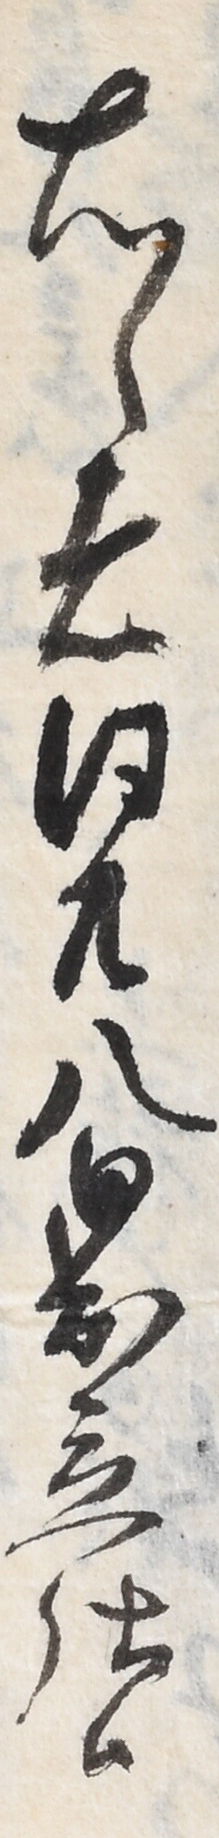右之者四月朔日出立仕候
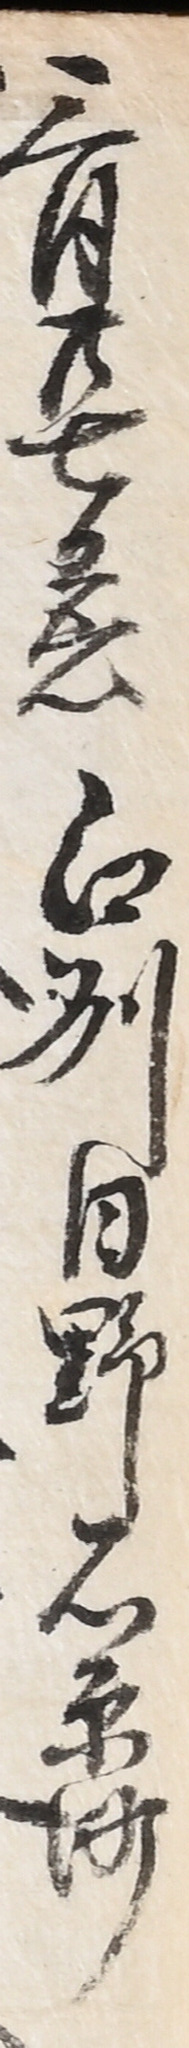三月廿七日着江州日野石原町
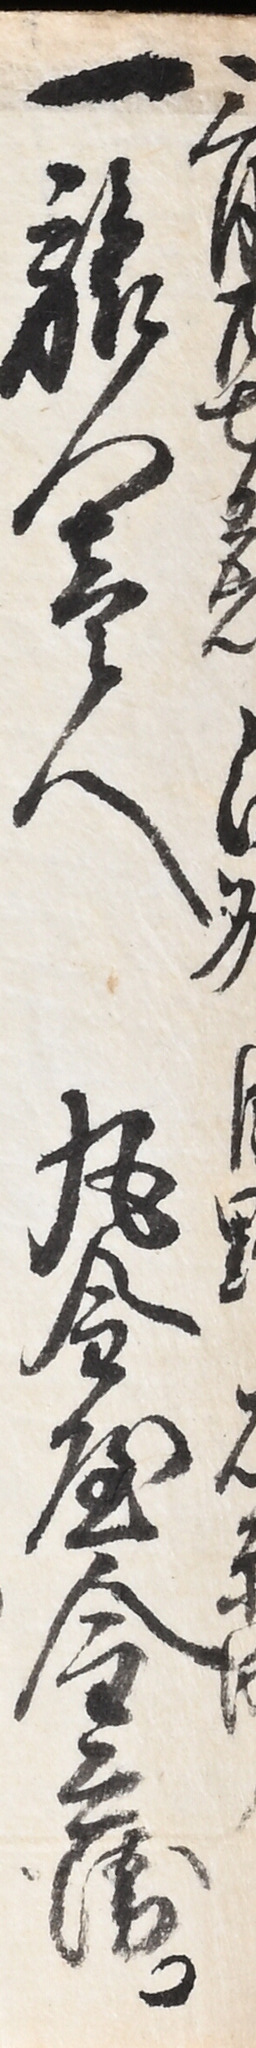一旅人壱人丸金屋金兵衛。
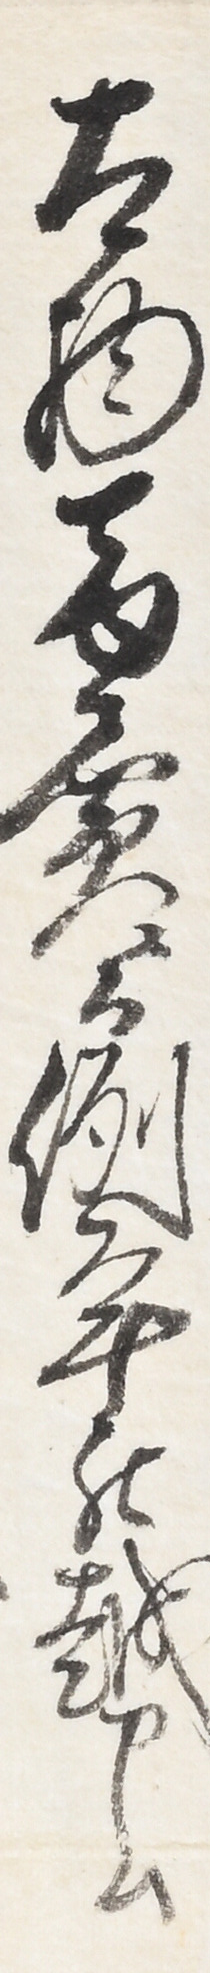太物商売ニ而例年罷越申候
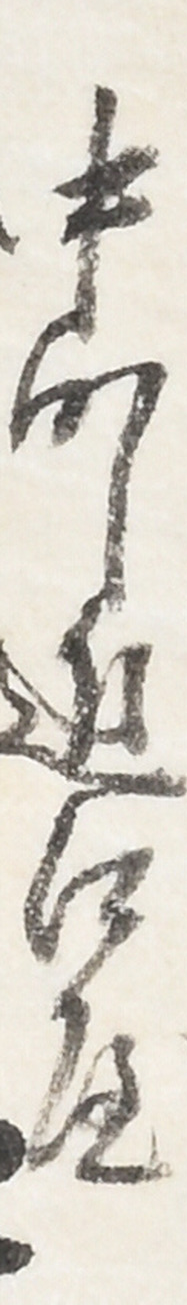中町近江屋
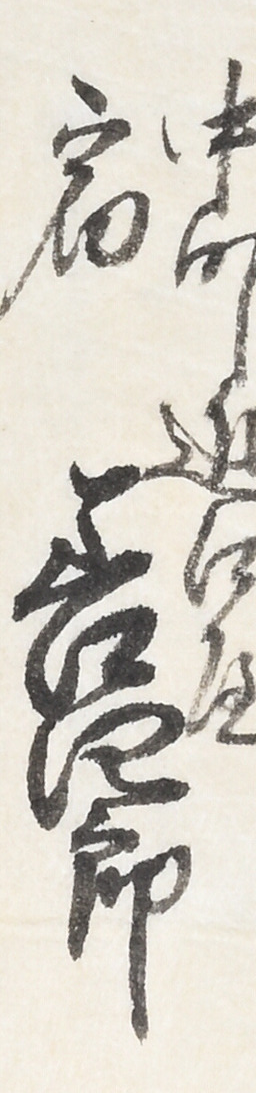宿善四郎
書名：旅人泊控帳
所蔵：伊那市立高遠町図書館・合同会社AMANE
